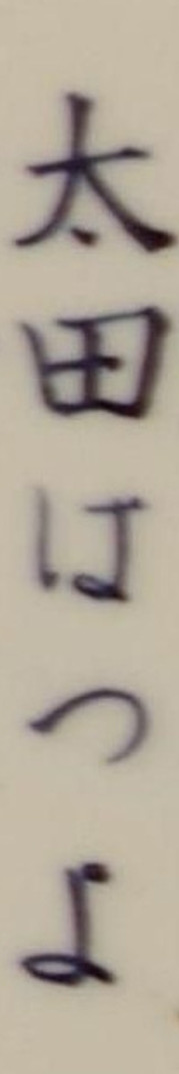太田はつよ
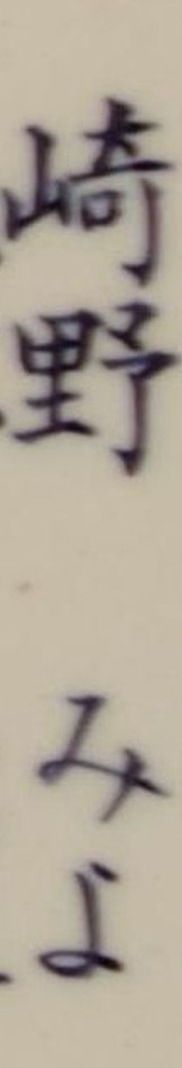崎野みよ
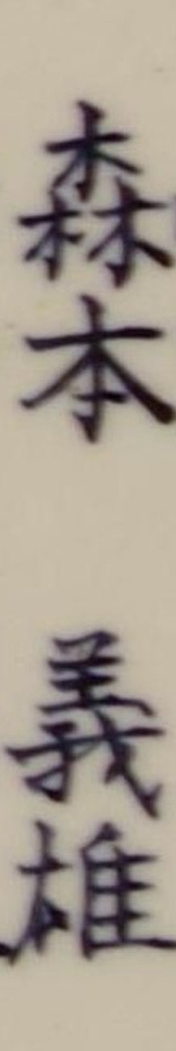森本義雄
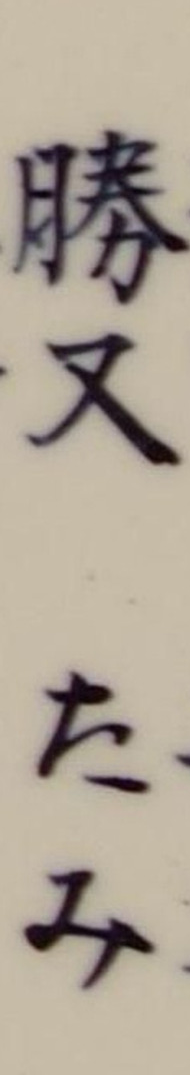勝又たみ
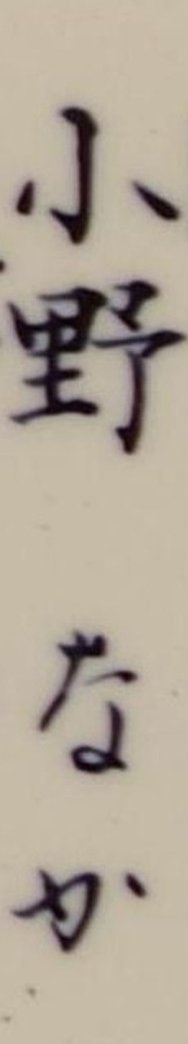小野なか
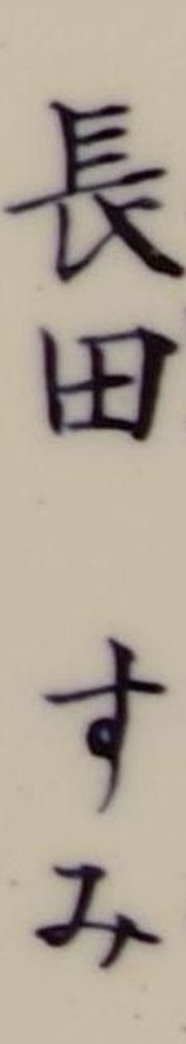長田すみ
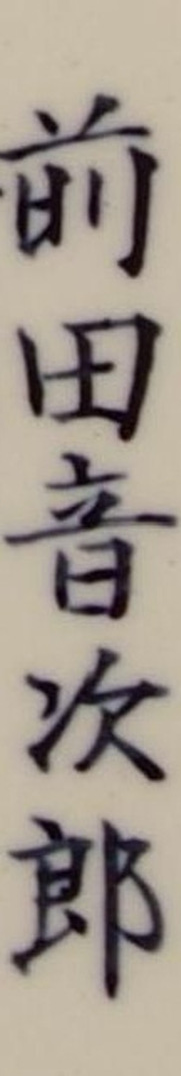前田音次郎
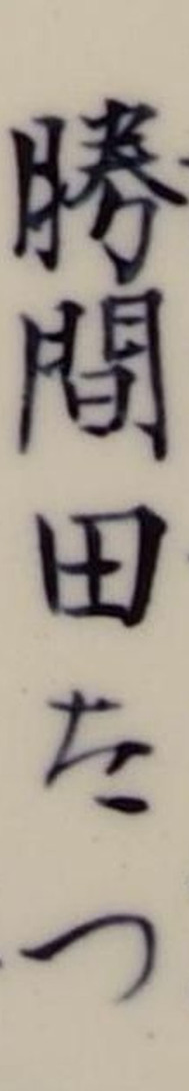勝間田たつ
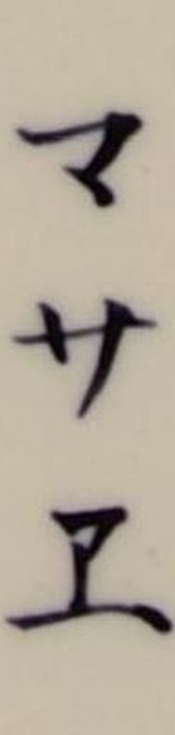マサエ
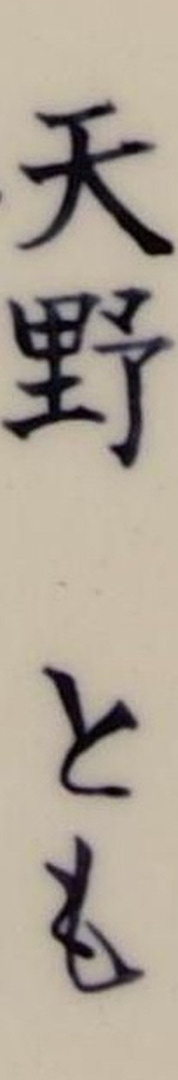天野とも
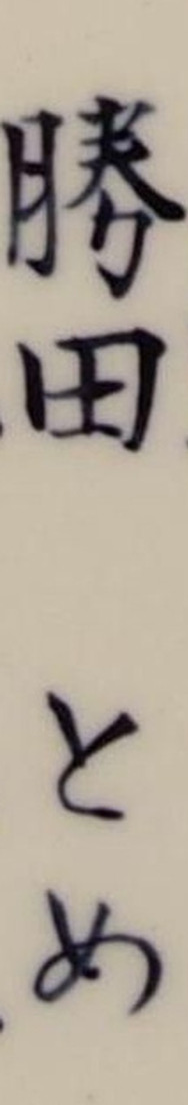勝田とめ
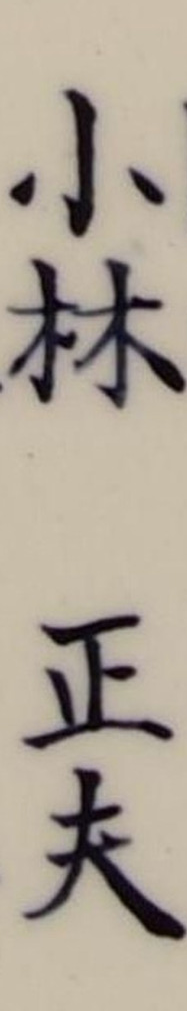小林正夫
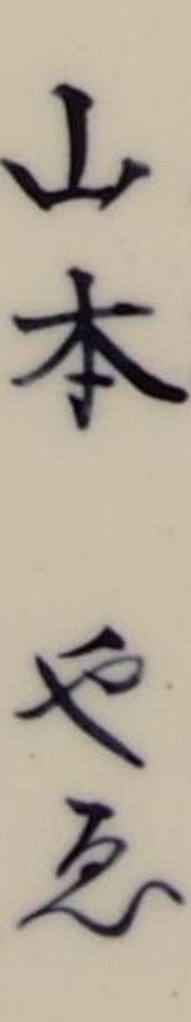山本やゑ
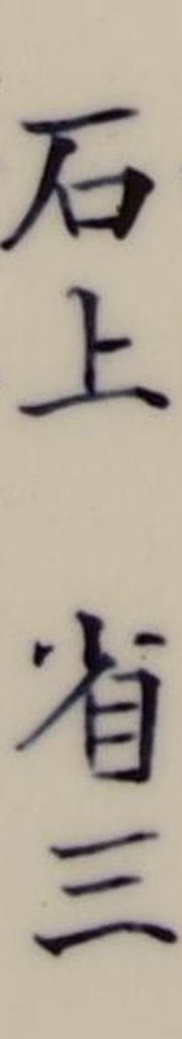石上省三
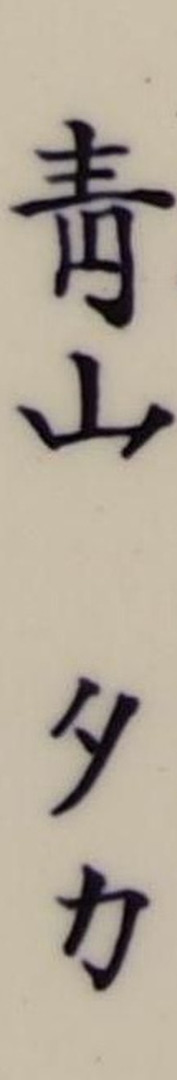青山タカ
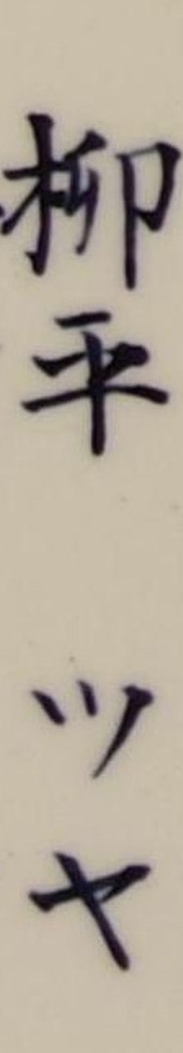柳平ツヤ
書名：E~L
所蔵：高野山金剛峯寺
